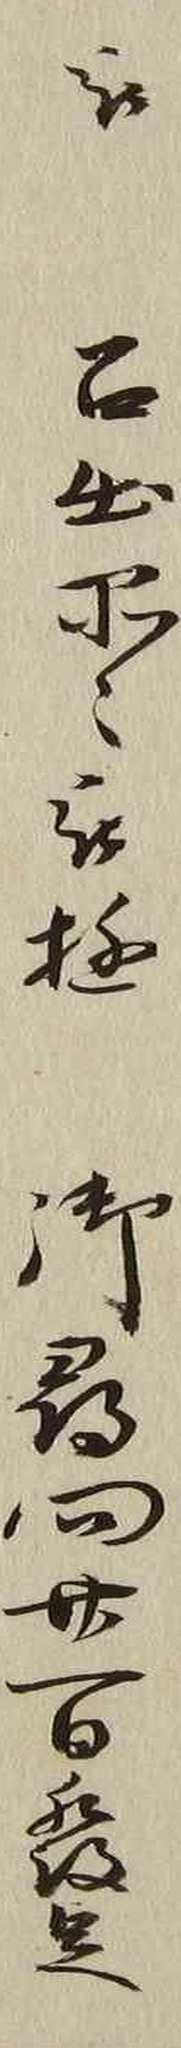被召出品々被遊御尋問廿一日発足
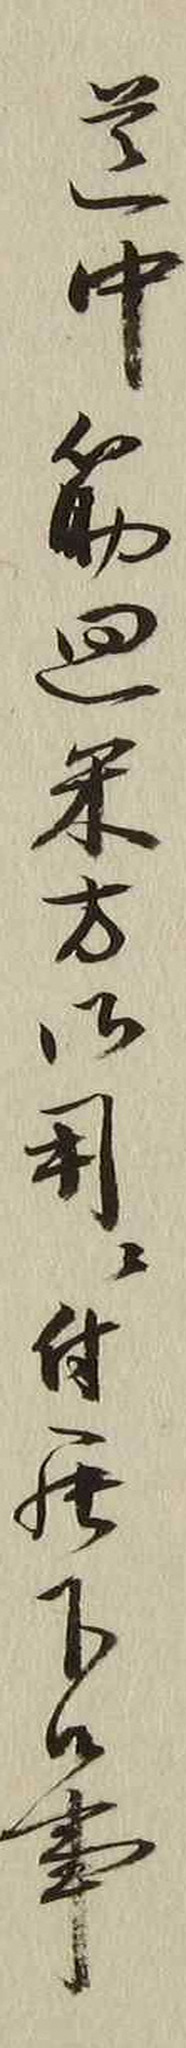道中筋廻米方御用ニ付罷下候事
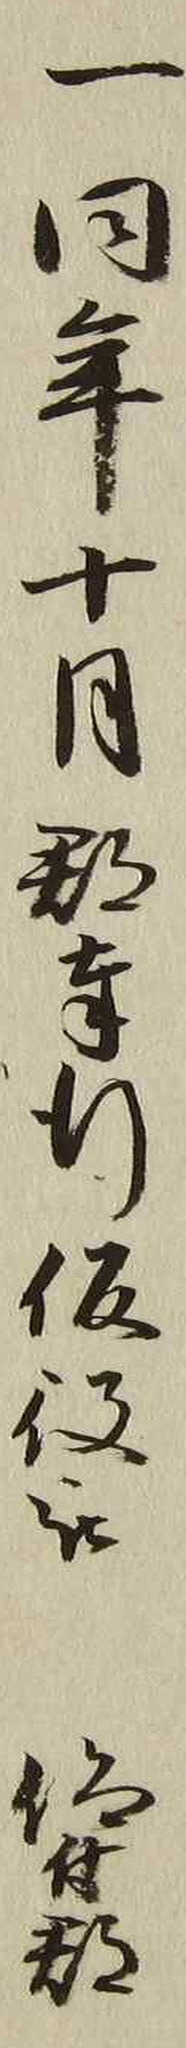一同年十月郡奉行仮役被仰付郡
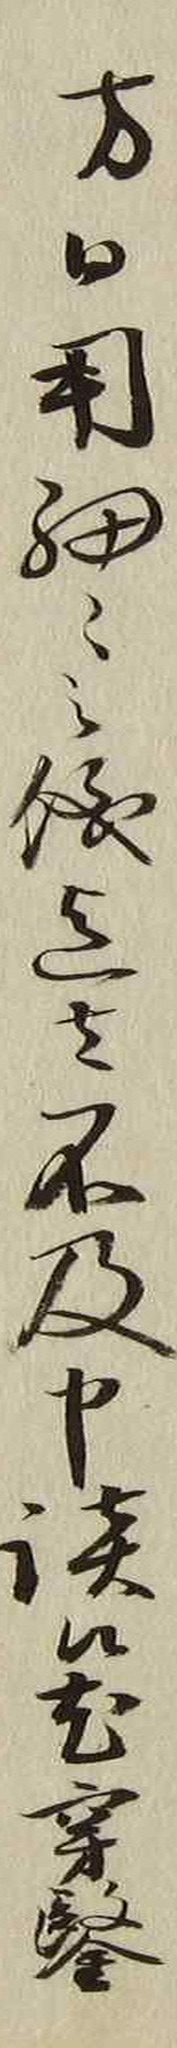方日用細々之儀迄者不及申談候尤穿鑿
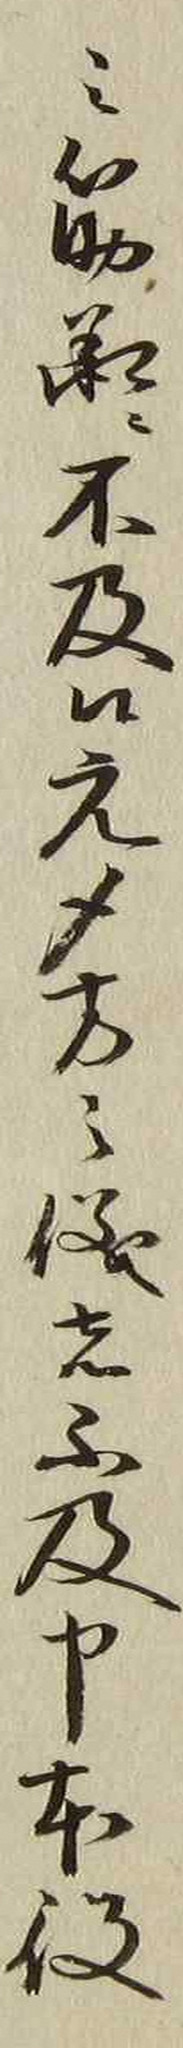之筋承ニ不及候元〆方之儀者不及申本役
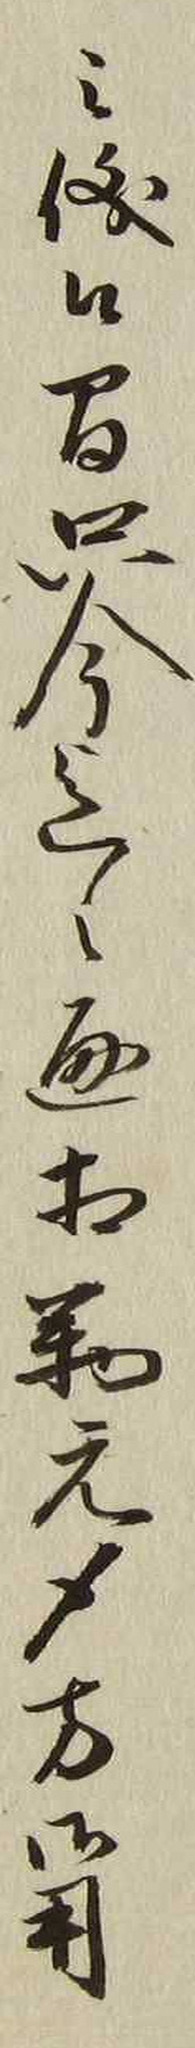之儀候間只今迄之通相勤元〆方御用
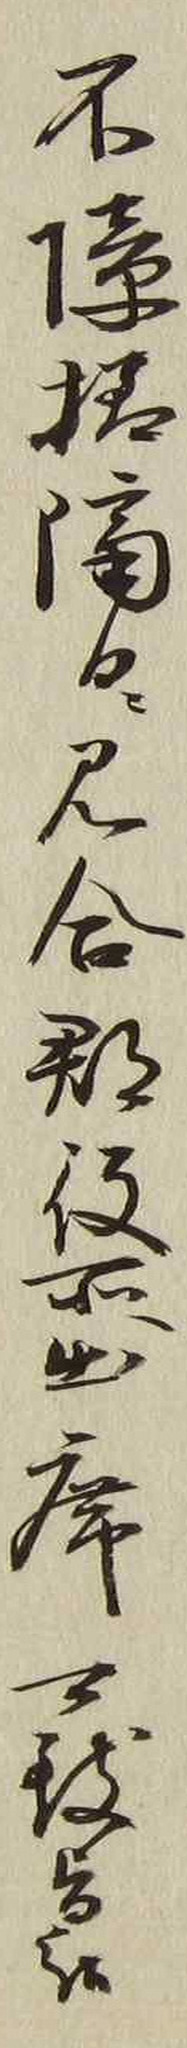不障様隔日ニ見合郡役所へ出席可致旨被
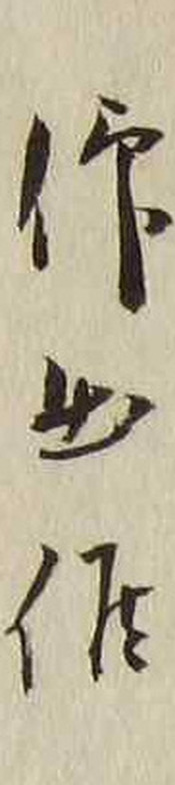仰出候
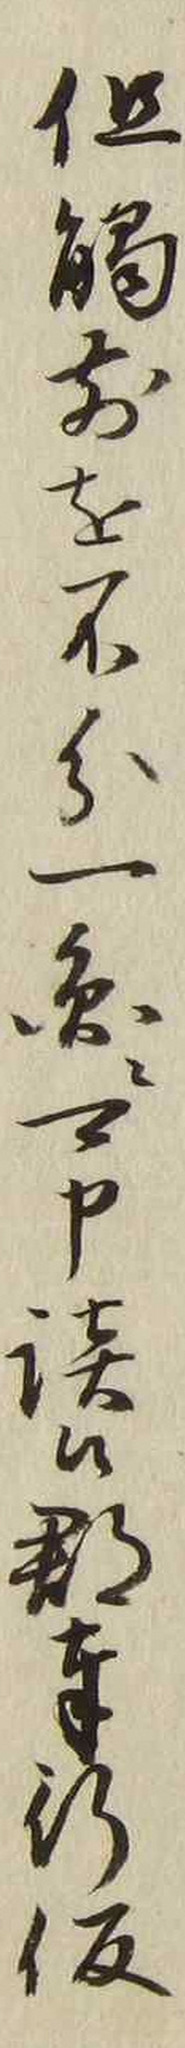但触前を不分一円ニ可申談候郡奉行仮

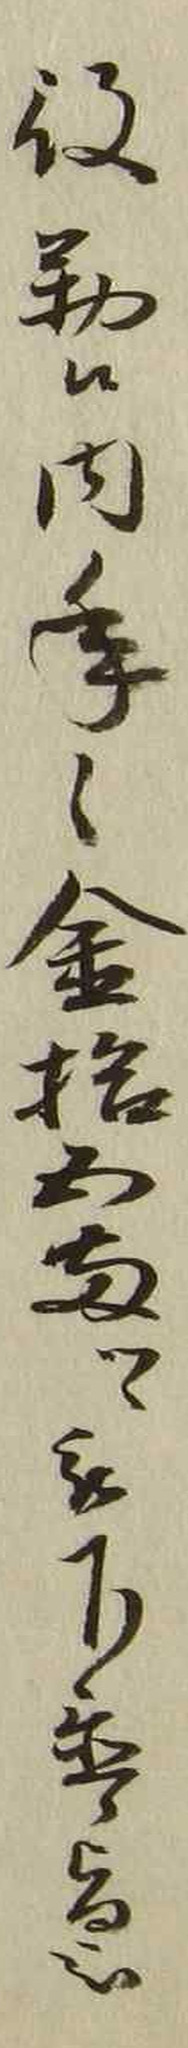役勤候内年々金拾五両ツ々被下置候旨被
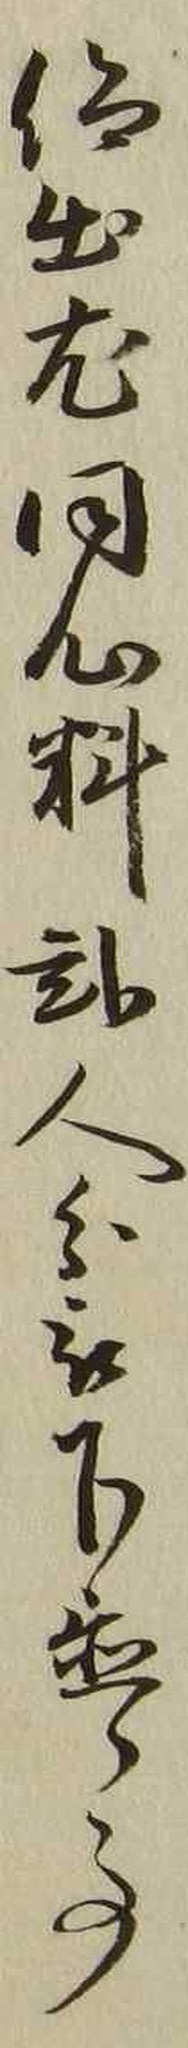仰出尤同心料弐人分被下置候事
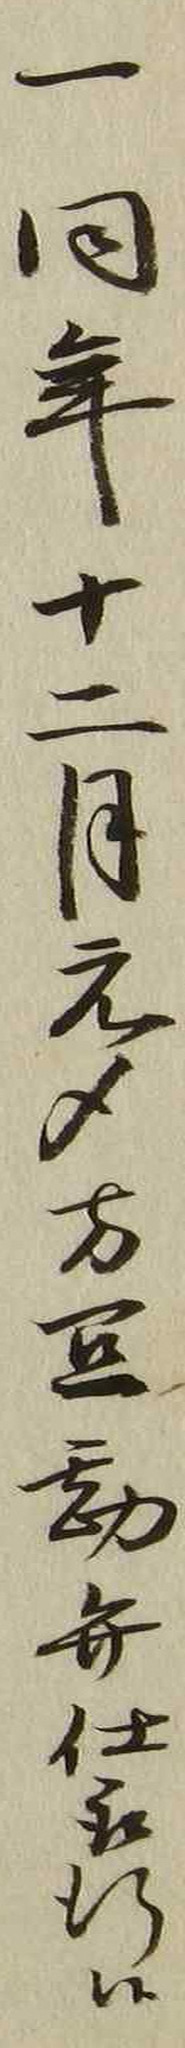一同年十二月元〆方宜勘弁仕取行候
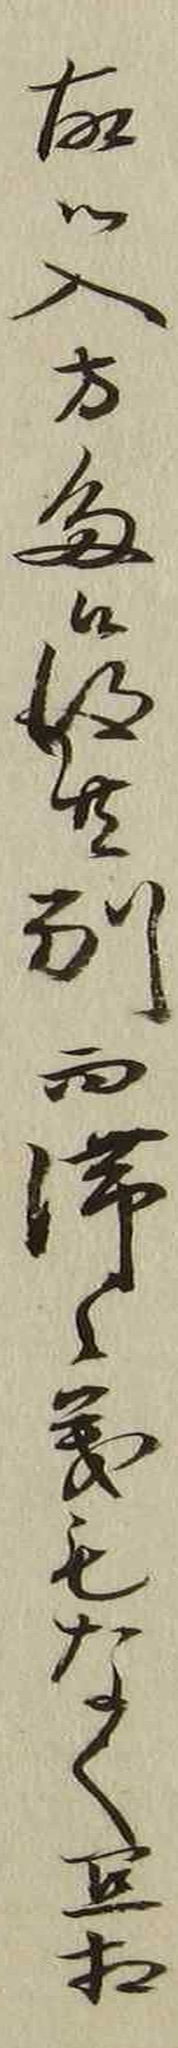故御入方多候得共別而滞候義もなく宜相
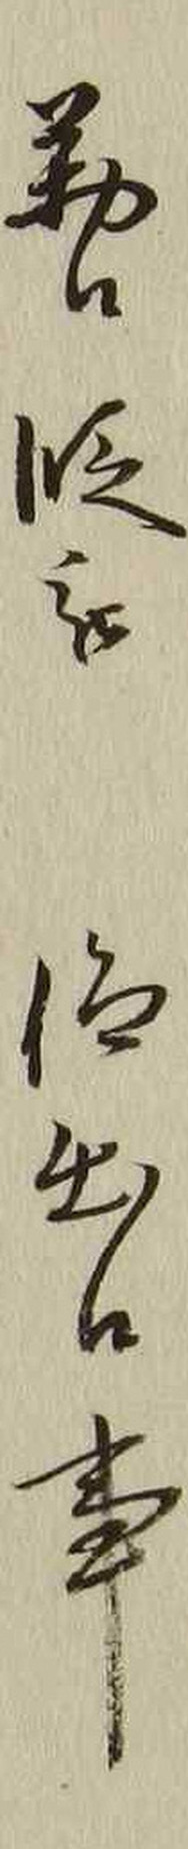勤候段被仰出候事
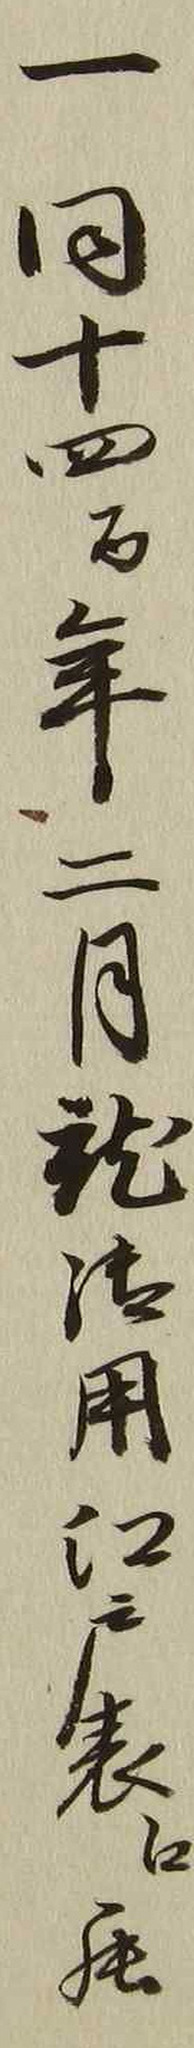一同十四酉年二月就御用江戸表江罷
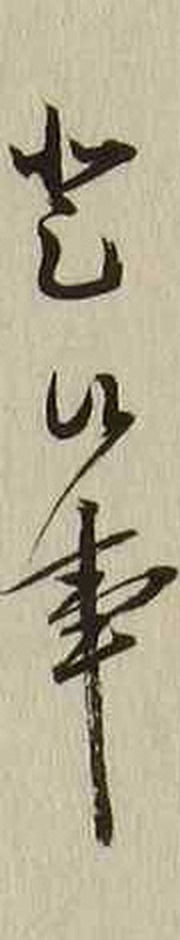登候事
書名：諸士系譜　巻之61　と之部4
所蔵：会津若松市立会津図書館
